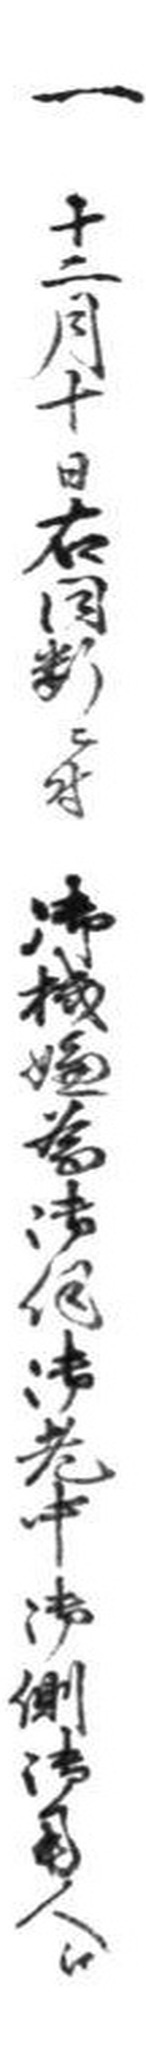一十二月十日右同断ニ付御機嫌為御伺御老中御側御用人江
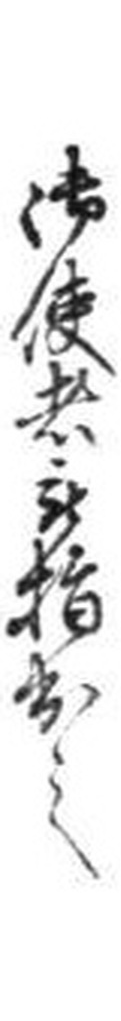御使者被指出之
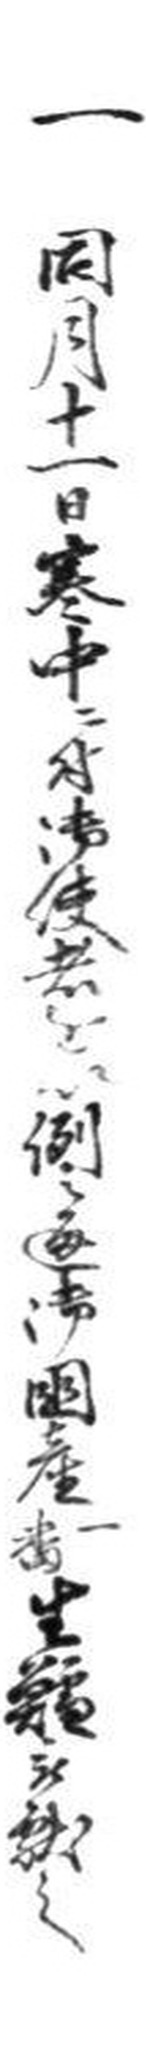一同月十一日寒中ニ付御使者を以例之通御国産一番生鱈被献之
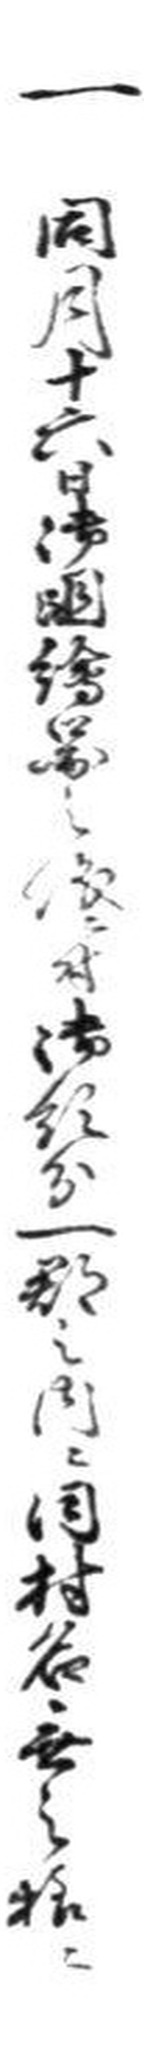一同月十六日御国絵図之儀ニ付御領分一郡之内同村名無之様ニ
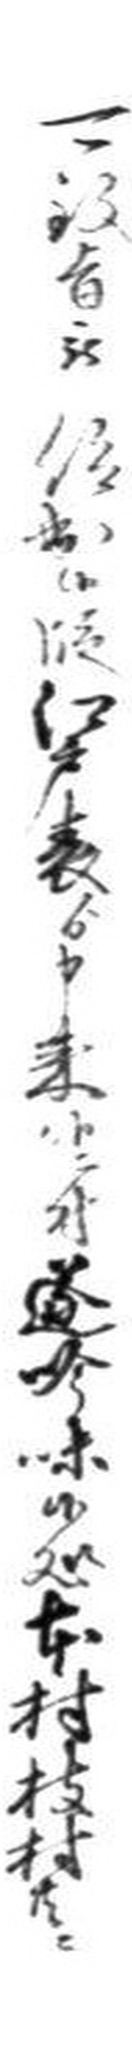可致旨被仰候段江戸表ゟ申来候ニ付遂吟味候処本村枝村共ニ
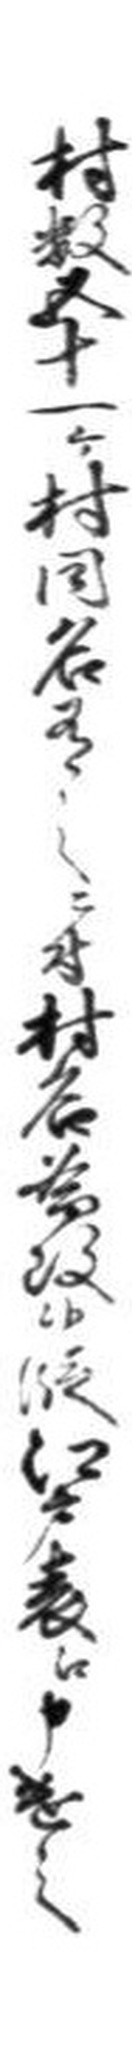村数五十一ケ村同名有之ニ付村名為改候段江戸表江申遣之
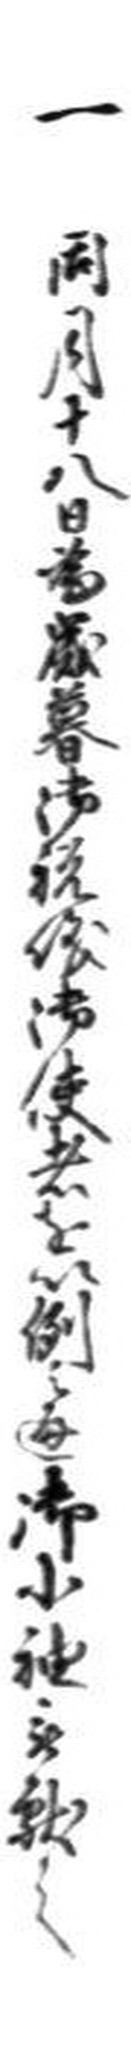一同月十八日為歳暮御祝儀御使者を以例之通御小袖被献之
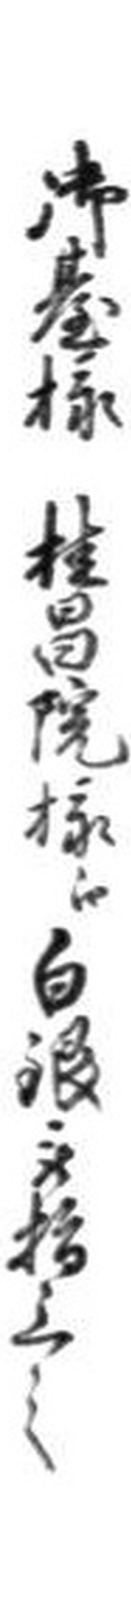尾臺様桂昌院様江白銀被指上之

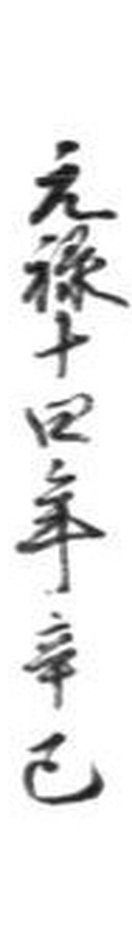元禄十四年辛己
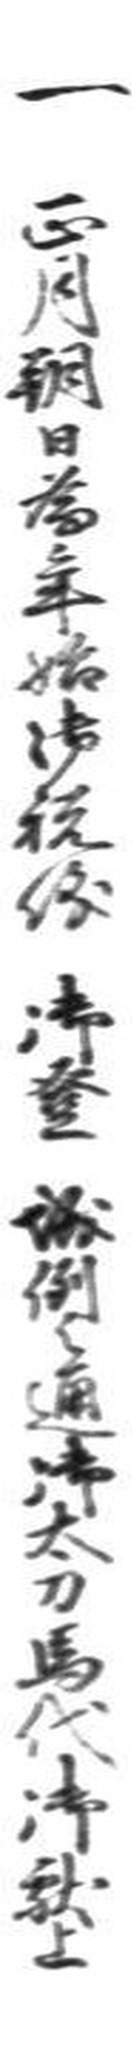一正月朔日為年始御祝儀御登城例之通御太刀馬代御献上
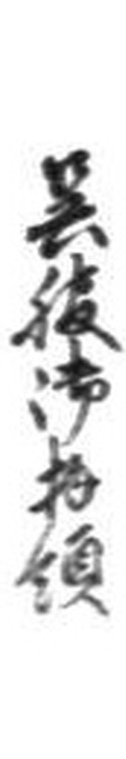呉服御拝領
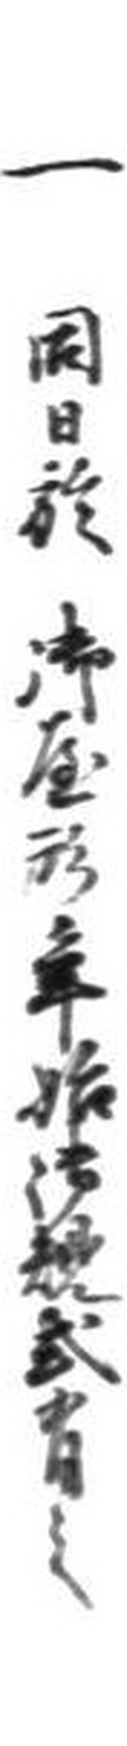一同日於御屋形年始御規式有之
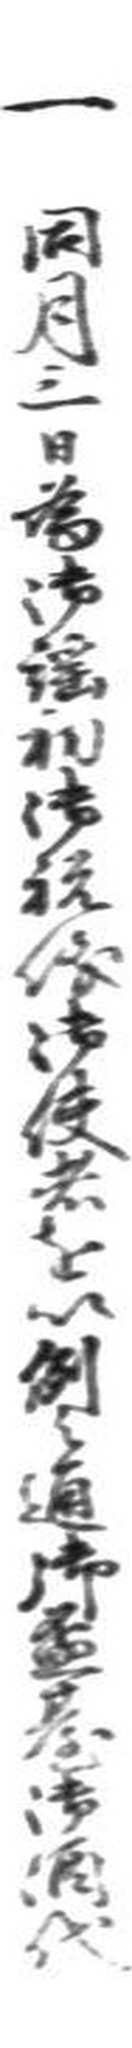一同月三日為御謡初御祝儀御使者を以例之通御盃臺御酒代
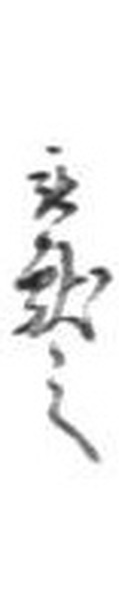被献之
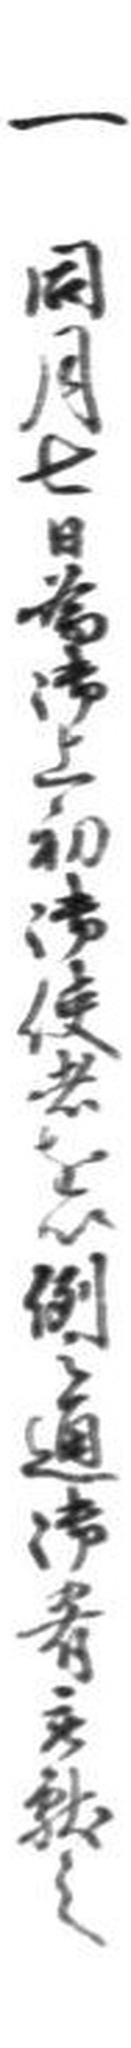一同月七日為御上初御使者を以例之通御肴被献之

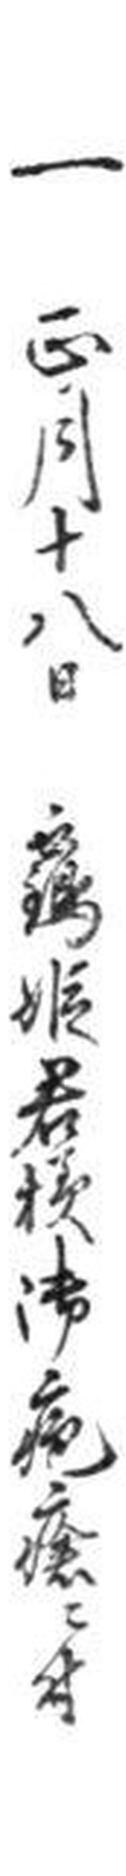一正月十八日鶴姫君様御疱瘡ニ付
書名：家譜 二十一 吉品公 従元禄十三年到同十四年
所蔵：福井県文書館 Fukui Prefectural Archives
